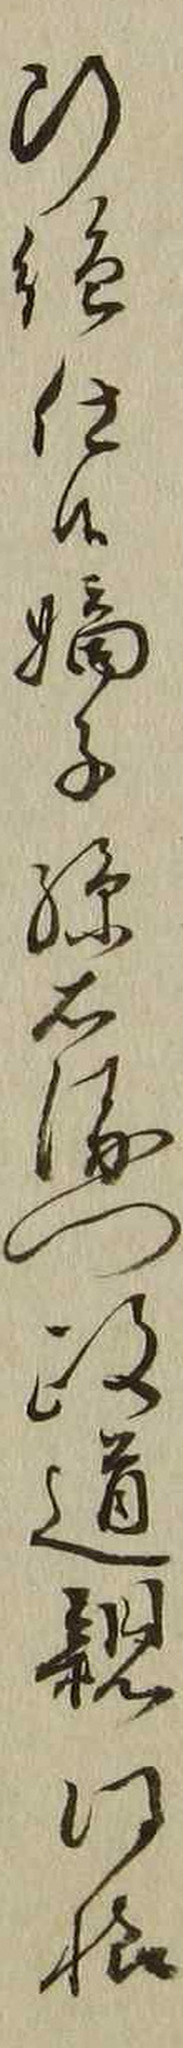断絶仕候嫡子孫右衛門政道親同様
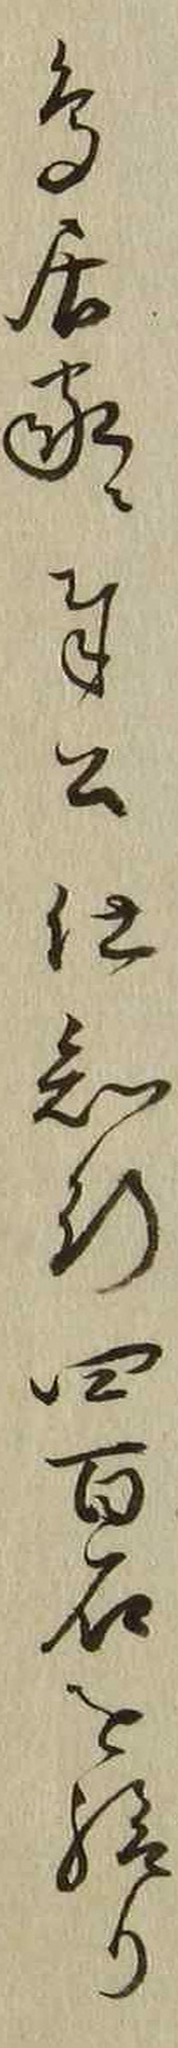鳥居家ニ奉公仕知行四百石を給り
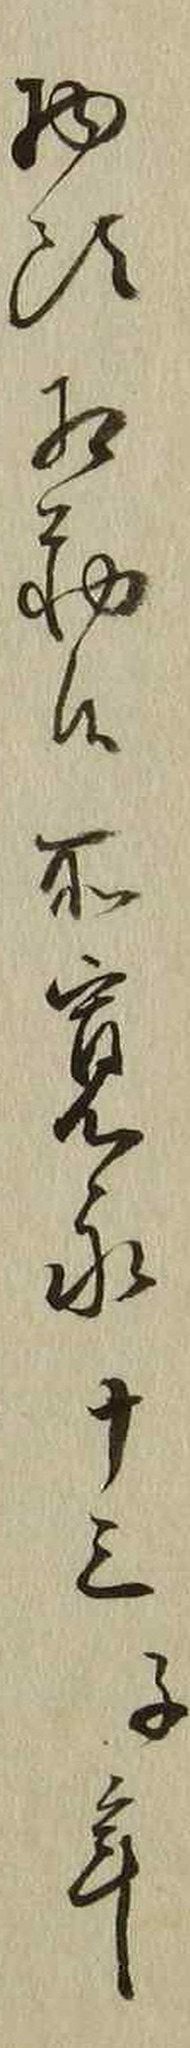物頭相勤候所寛永十三子年
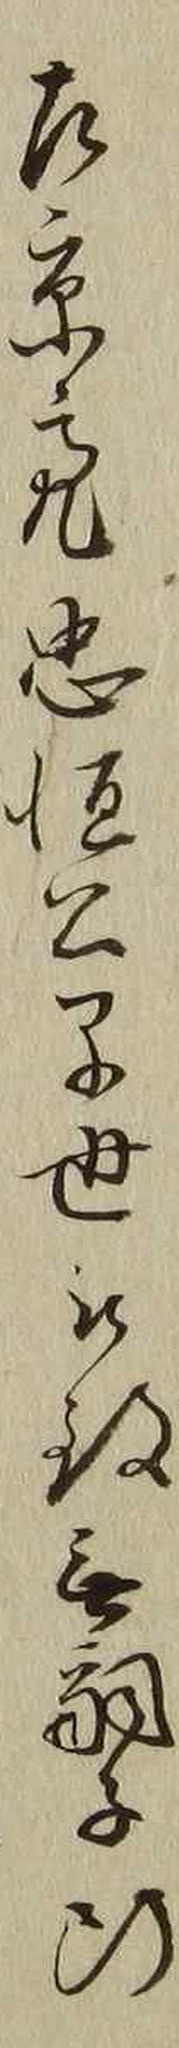左京亮忠恒公早世被致無嫡子断
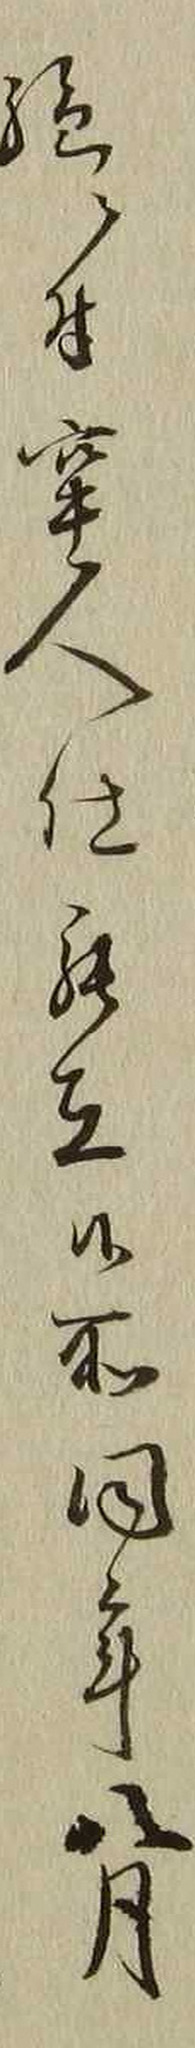絶ニ付牢人仕罷在候所同年八月
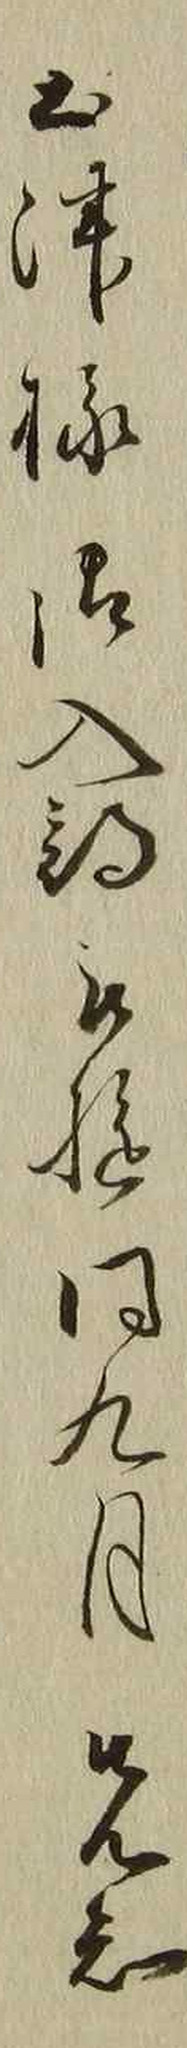土津様御入部被遊同九先知
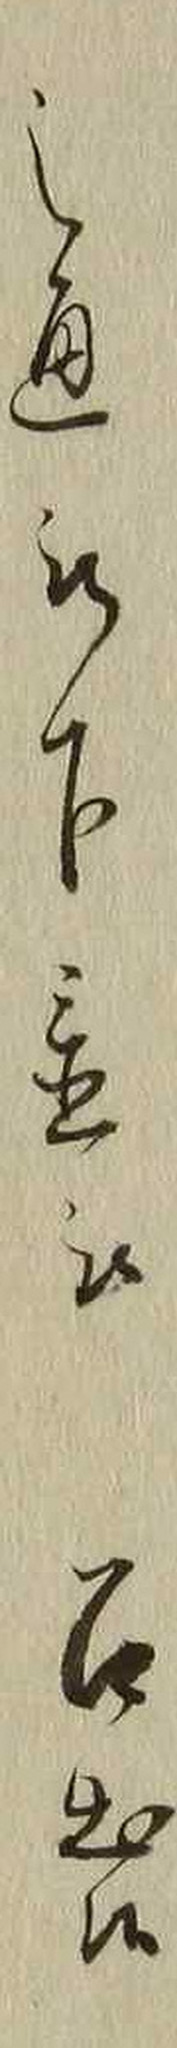之通被下置被召出候
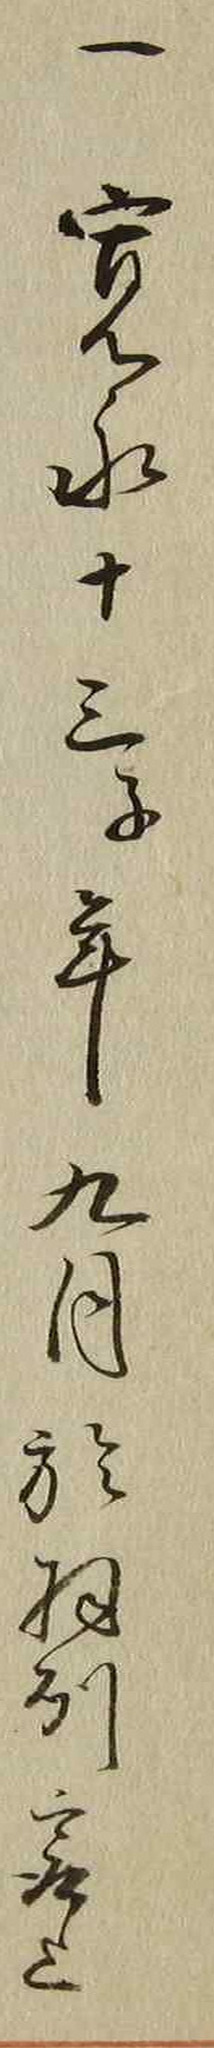一寛永十三子年九月於羽州最上
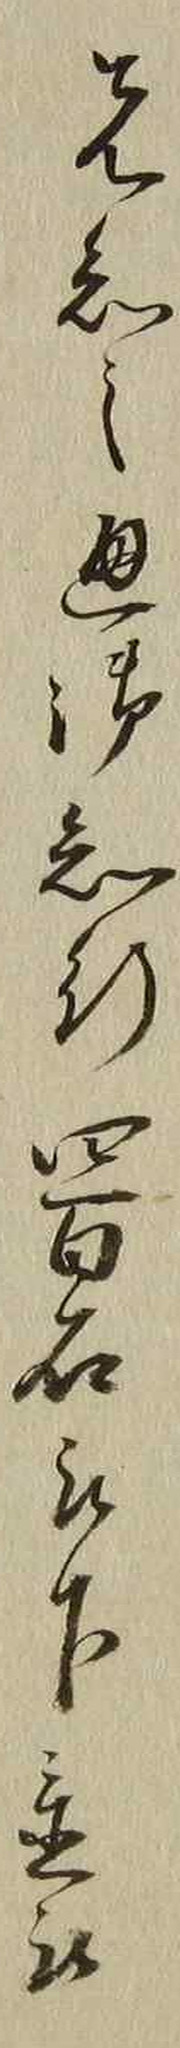先知之通御知行四百石被下置被
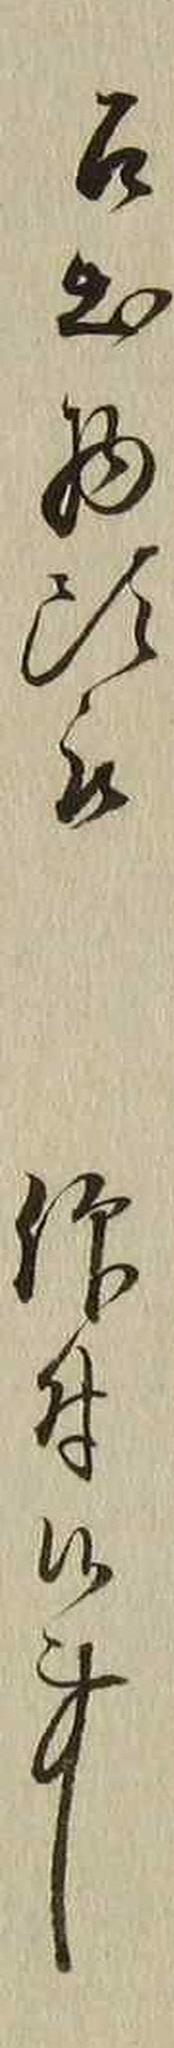召出物頭被仰付候事
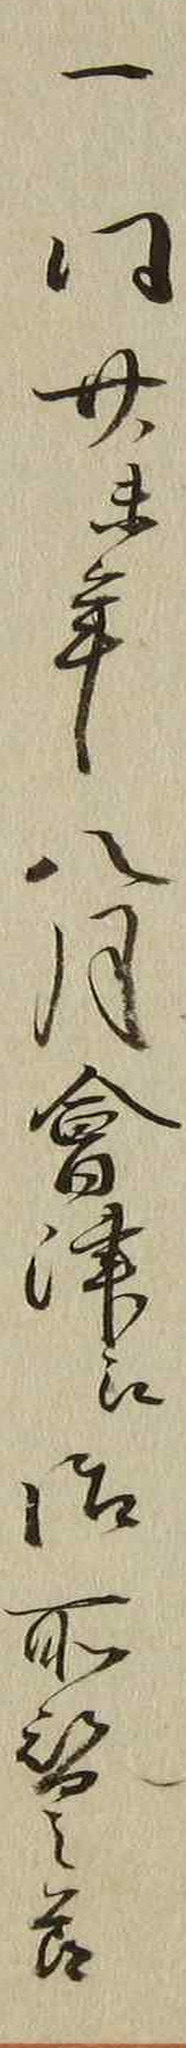一同廿未年八月会津江御所替之節
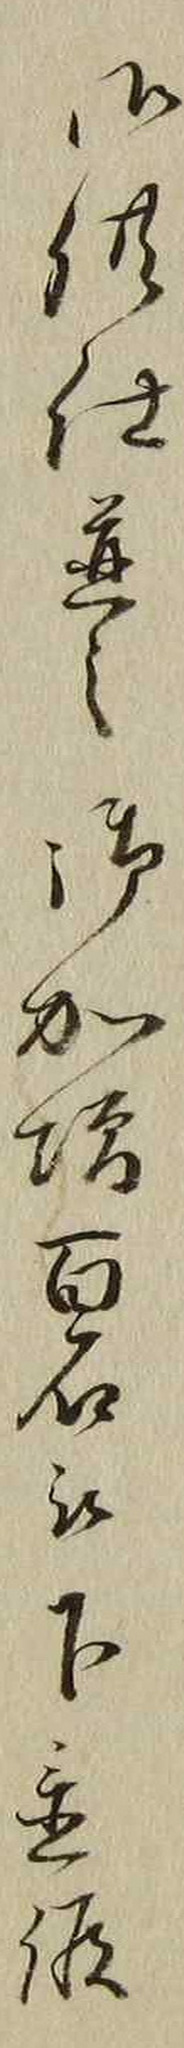御供仕並之御加増百石被下置候
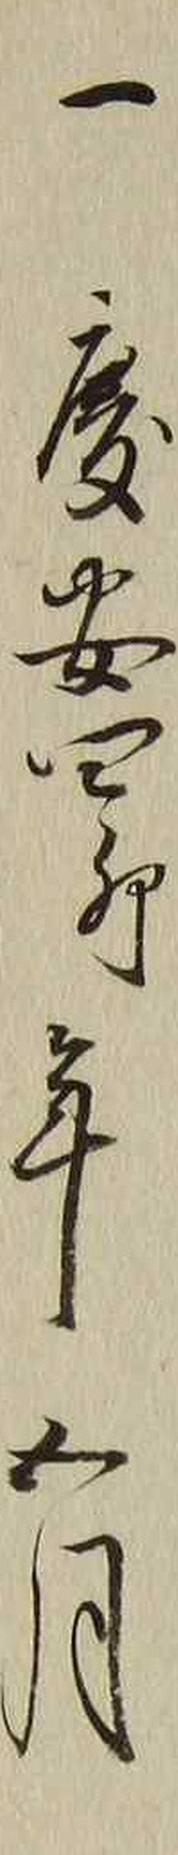一慶安四卯年五月
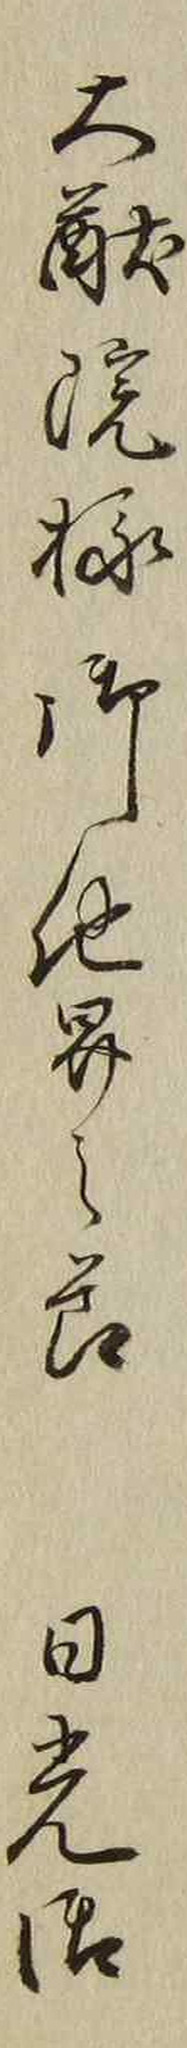大献院様御他界之節日光御
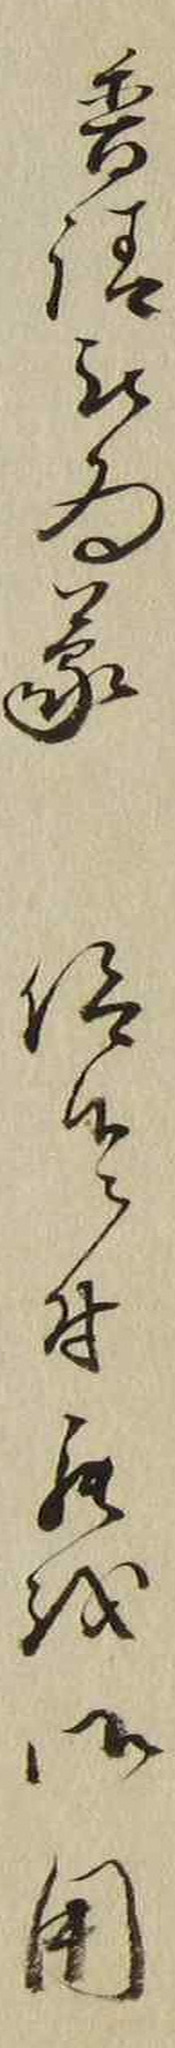普請被為蒙仰候ニ付罷越御用
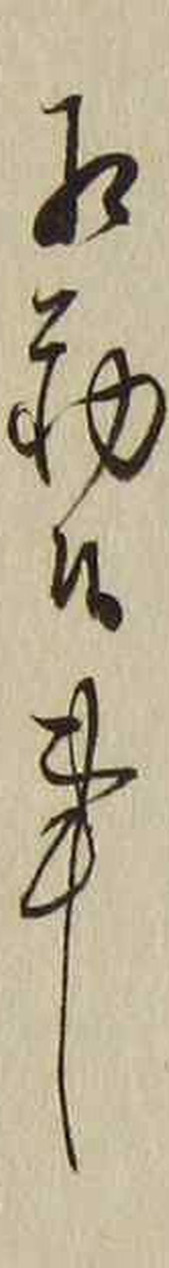相勤候事
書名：諸士系譜　巻之68　を之部2
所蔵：会津若松市立会津図書館
